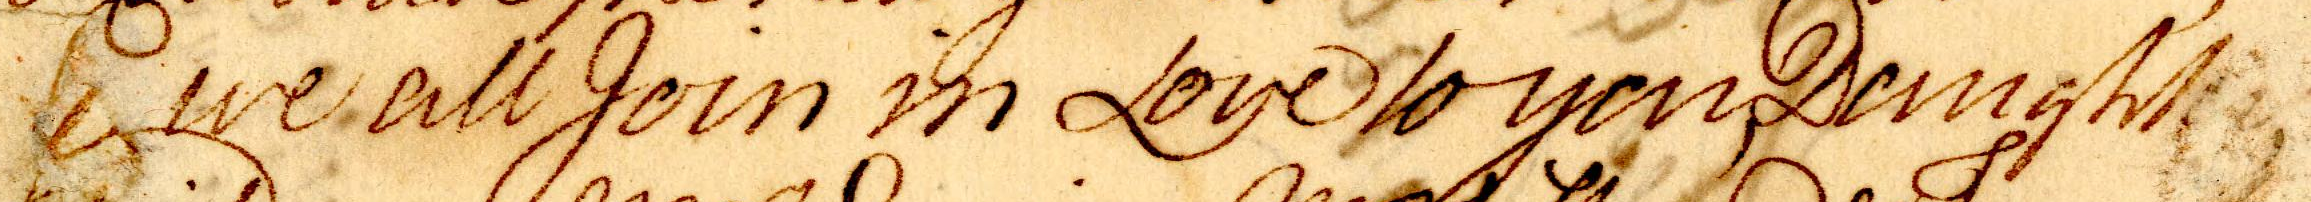We all Join in Love to your Daughter
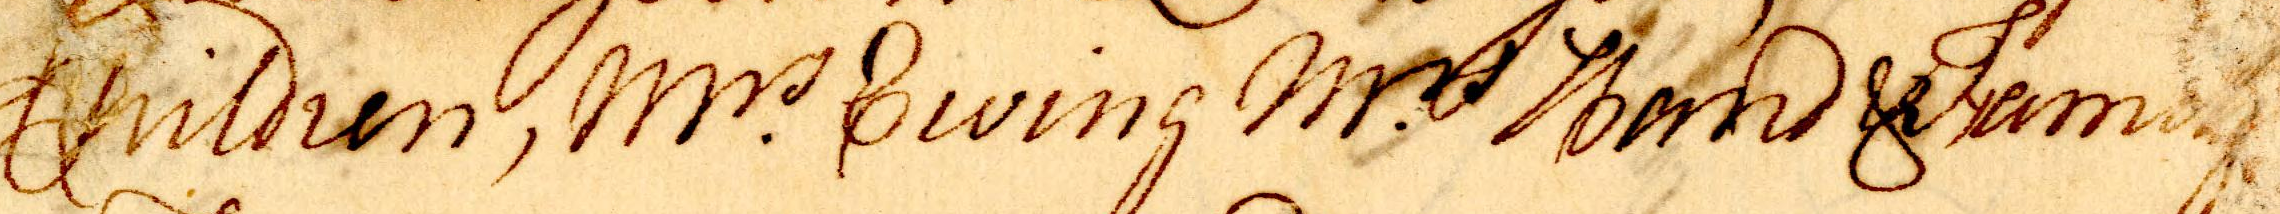Children, M^rs. Ewing M^r. Hand & Family
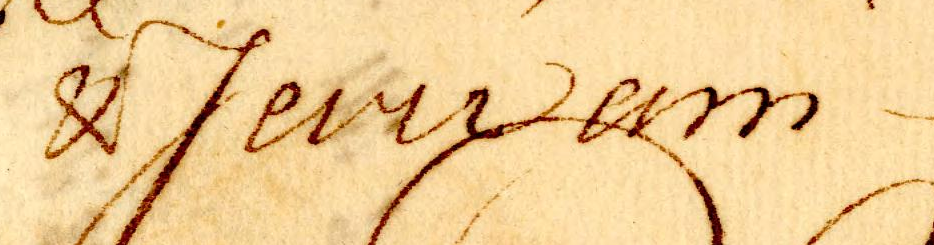& I ever am
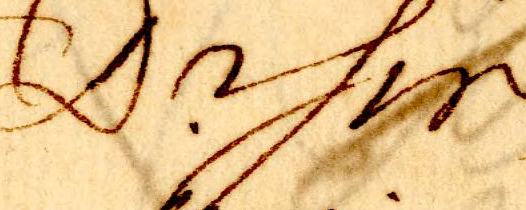D^r. Sir
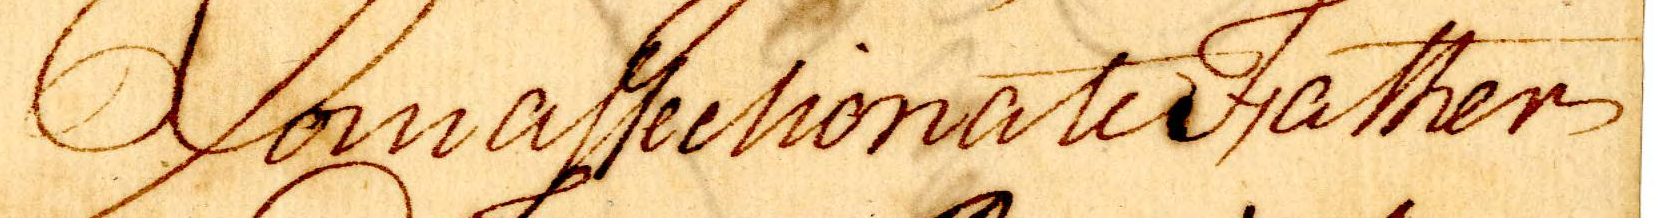Your affectionate Father
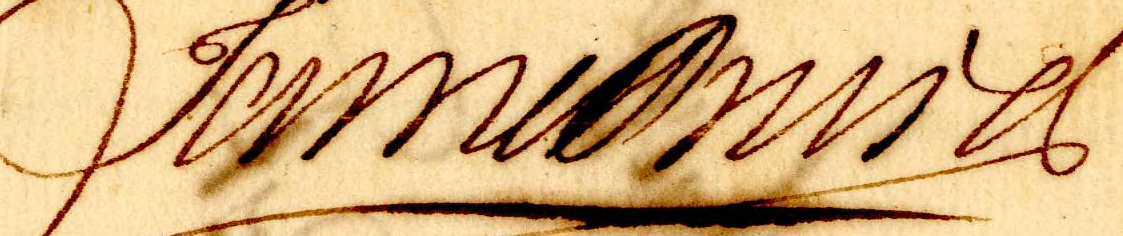James Burd
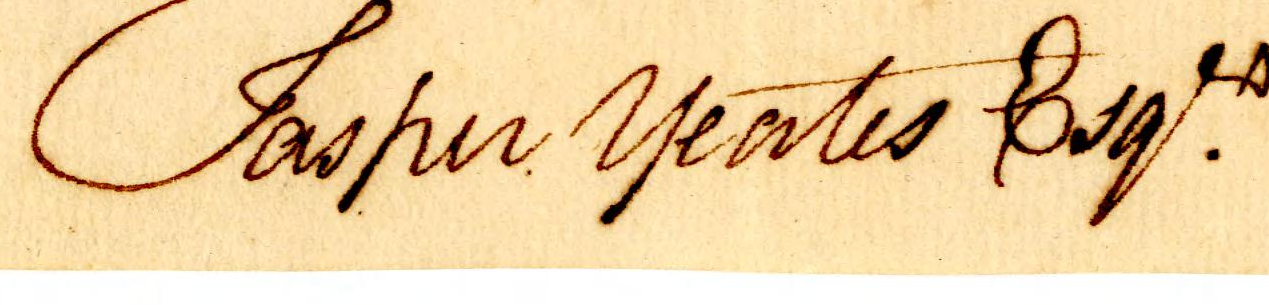Jasper Yeates Esq^r.
